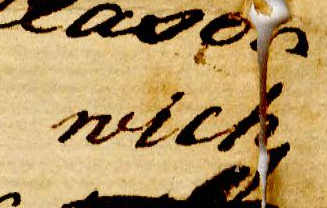wich
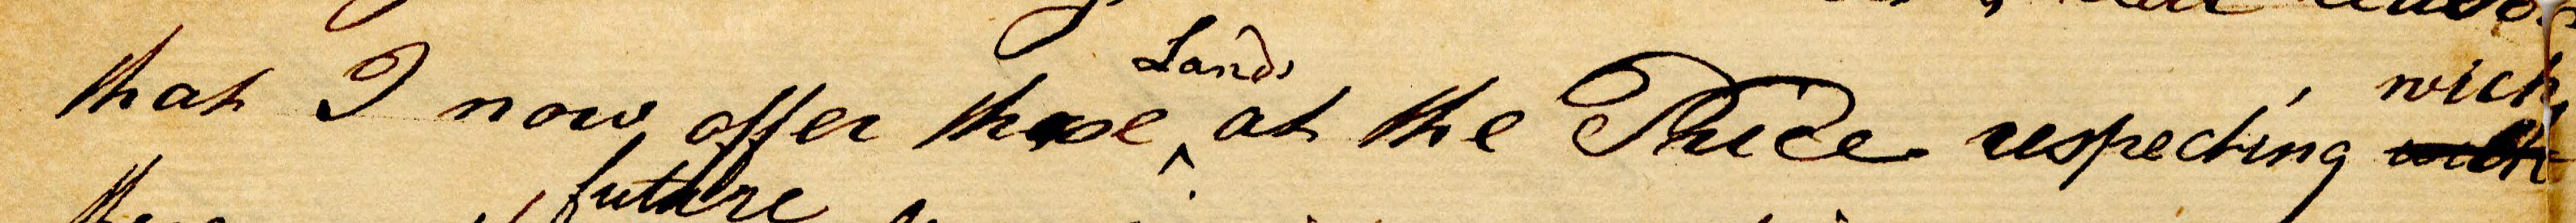that I now off these ^ at the Price respecting [with]
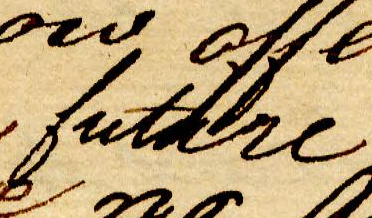future
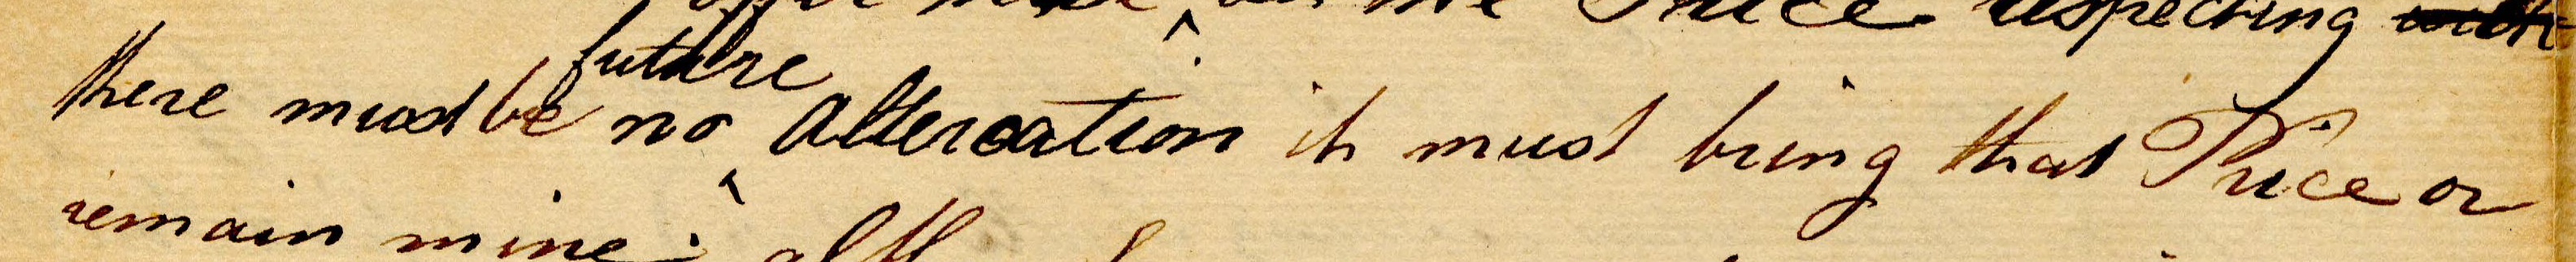there must be no ^ altercation it must bring that Price or
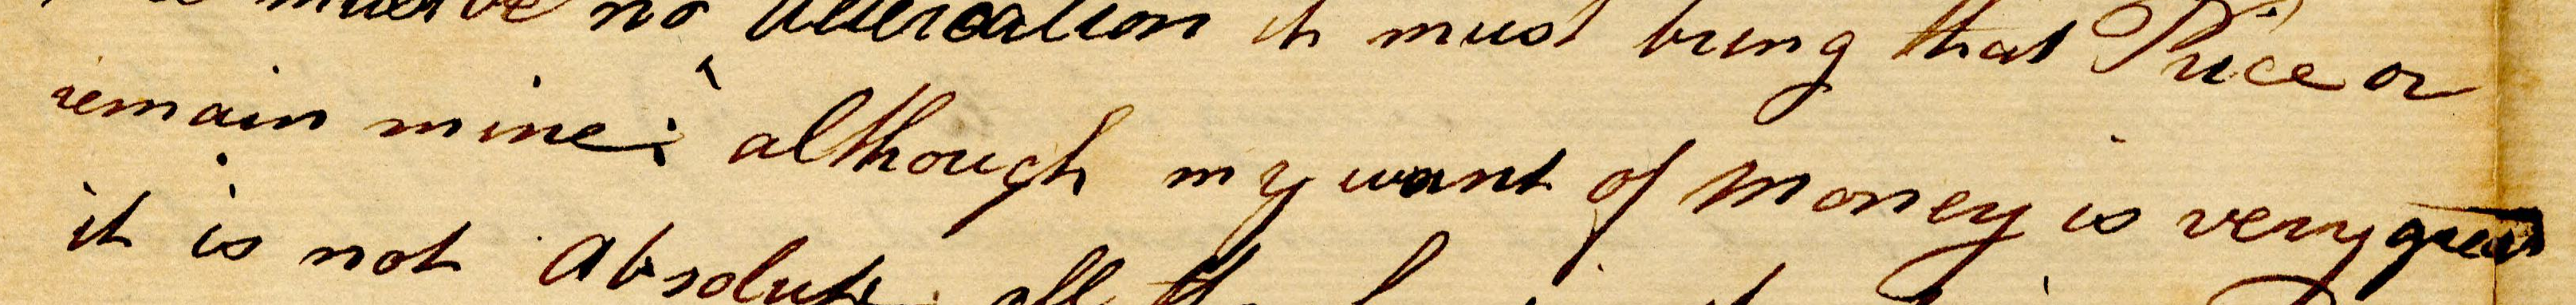remain mine; although my want of money is very great
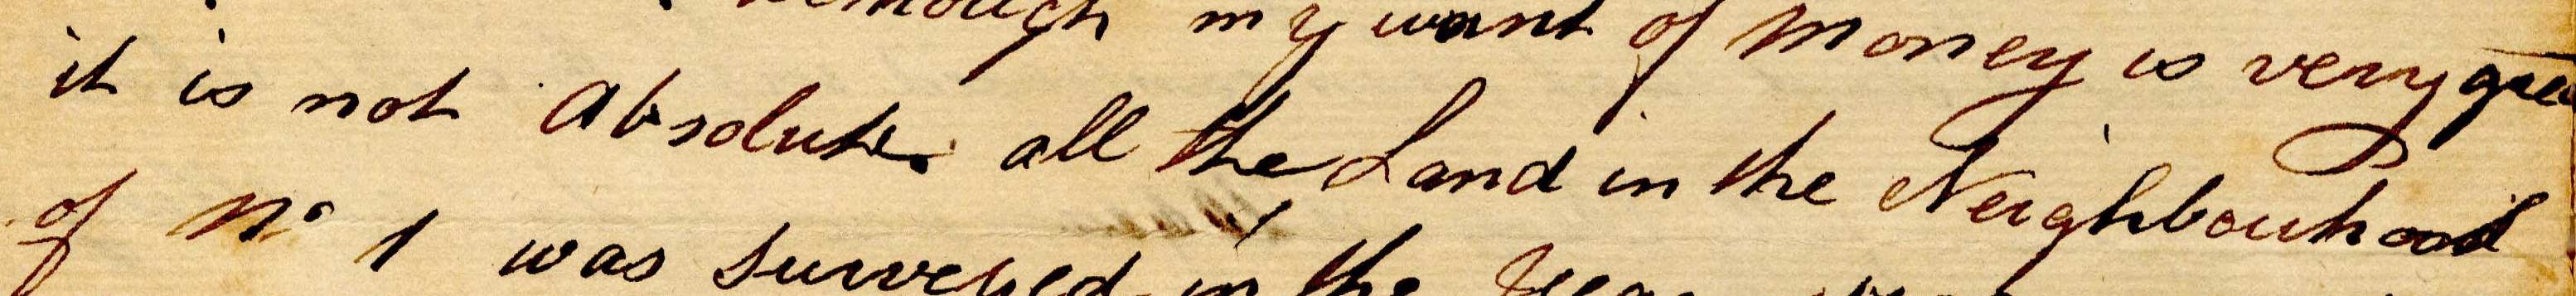it is not Absolute. all the Land in the Neighbourhood
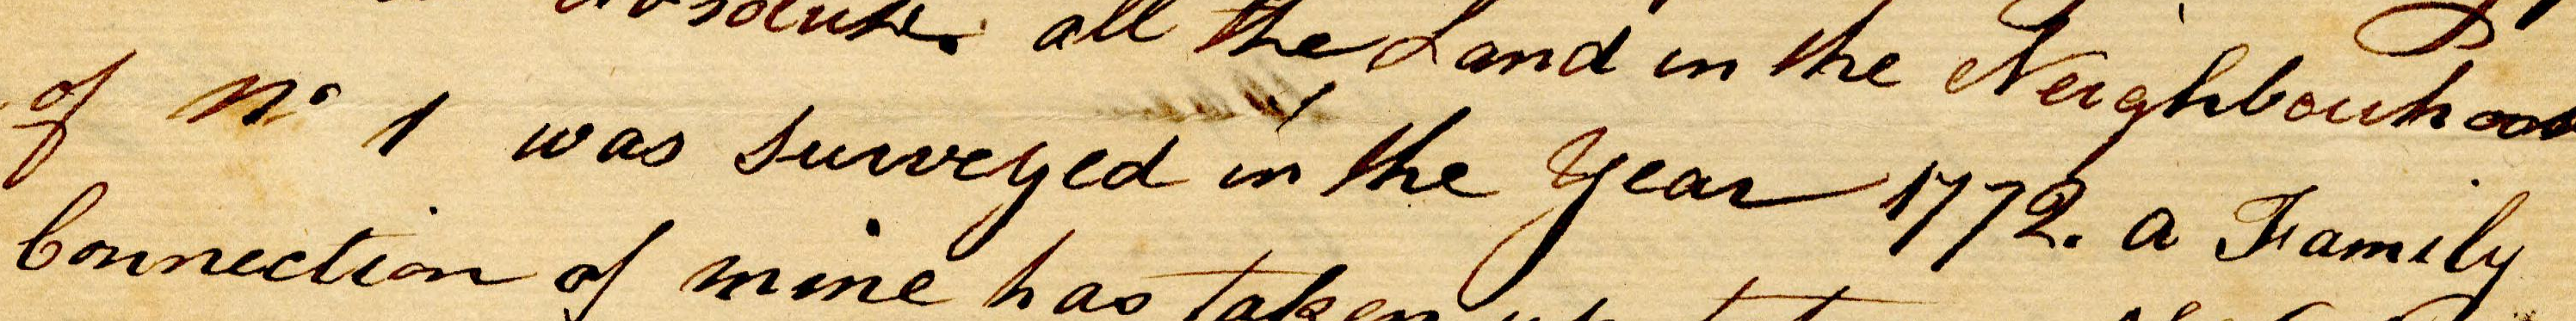of N^o 1 was surveyed in the Year 1772. a Family
